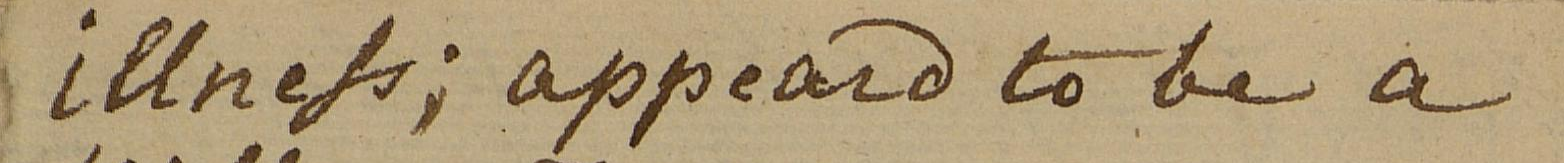illness; appeard to be a
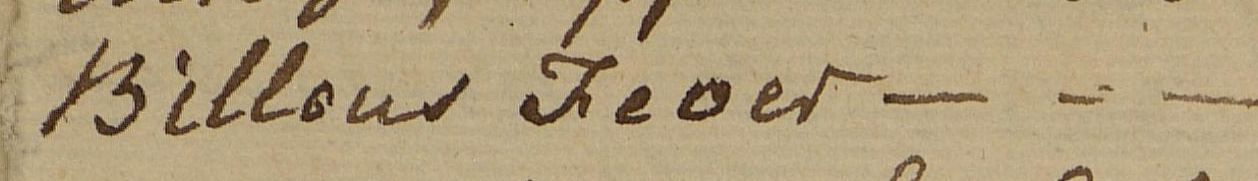Billous Fever---
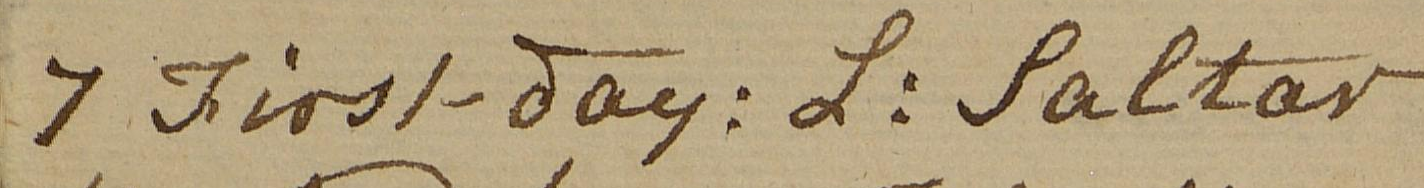7 First day: L: Saltar
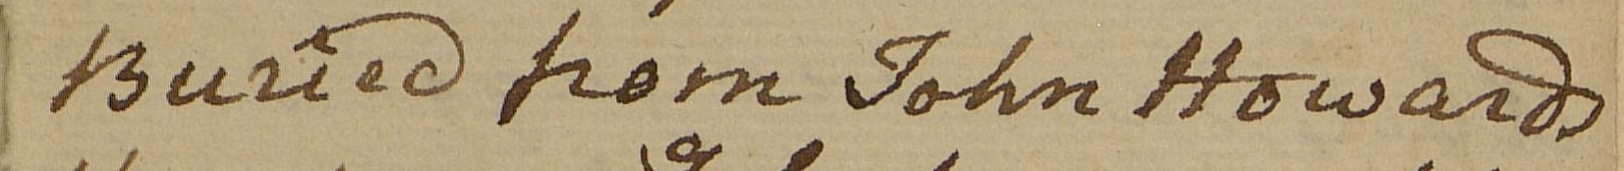Buried from John Howards
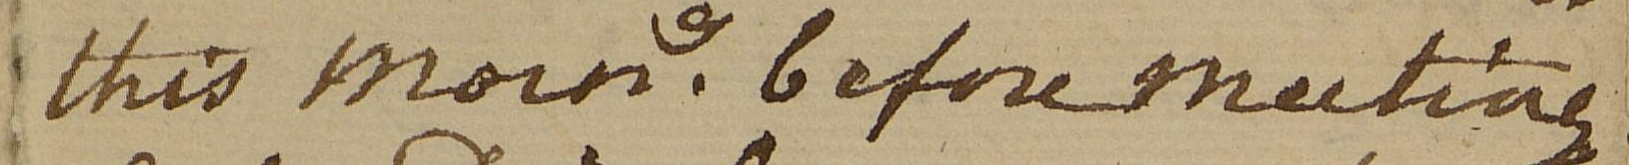this morn^g. before meeting
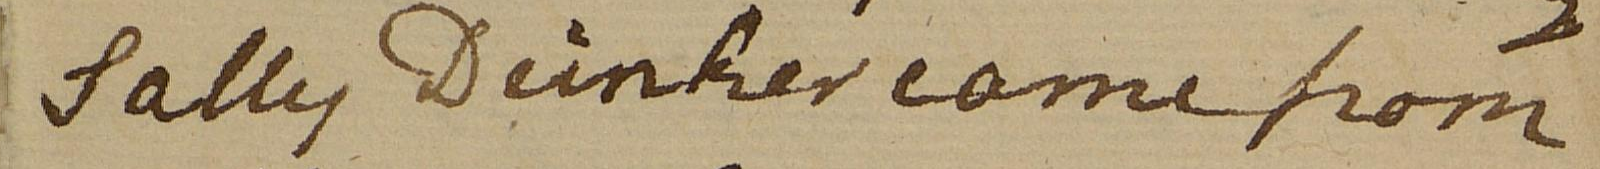Sally Drinker came from
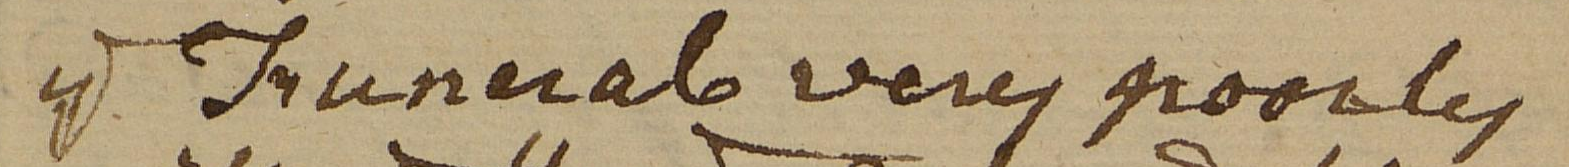y^e Funeral very poorly
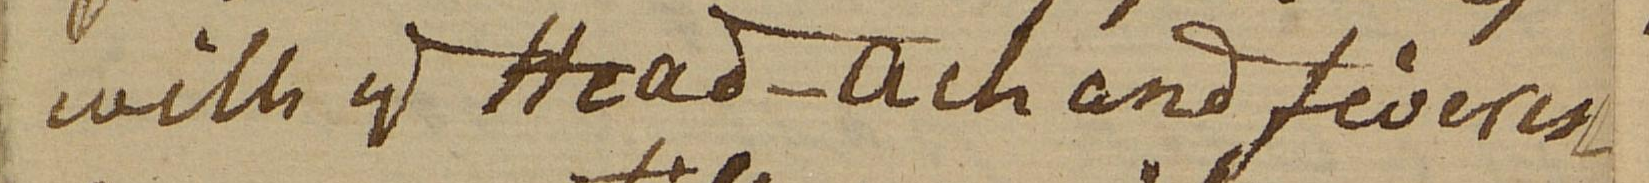will y^e Head-Ach and feveres
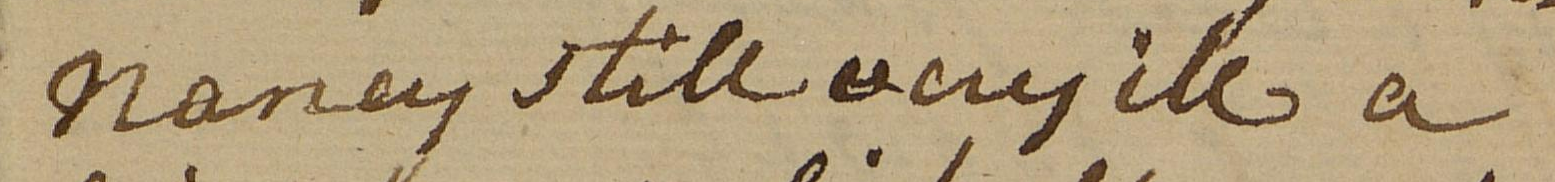Nancy still very ill a
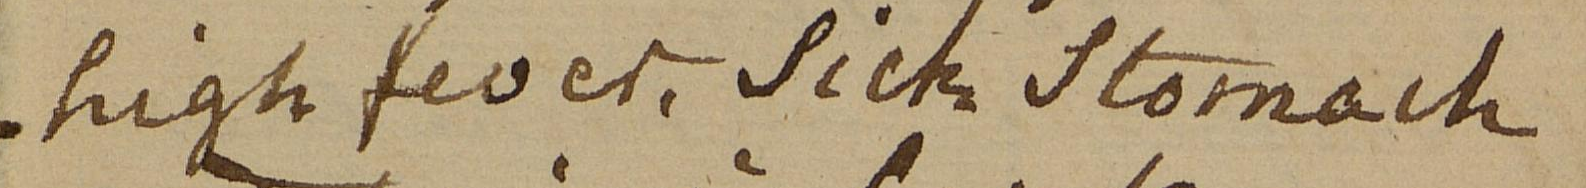high fever, Sick Stomach,
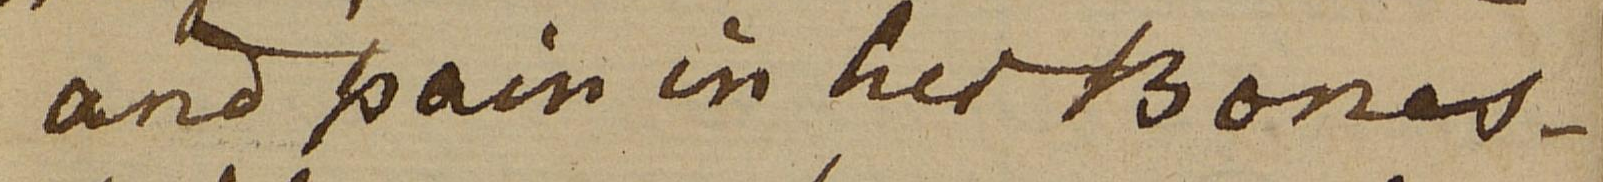and pain in her Bones.
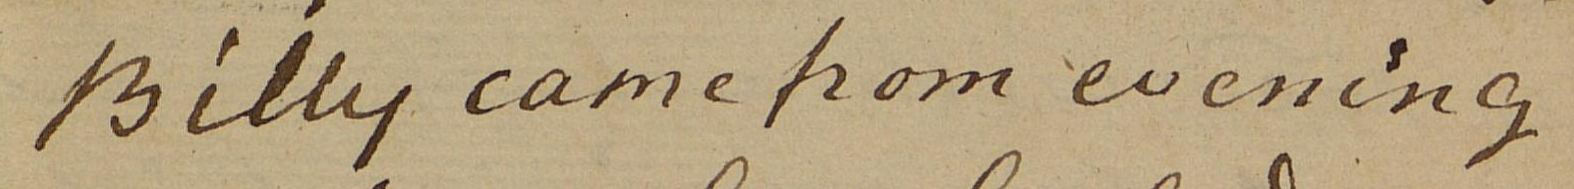Billy came from evening
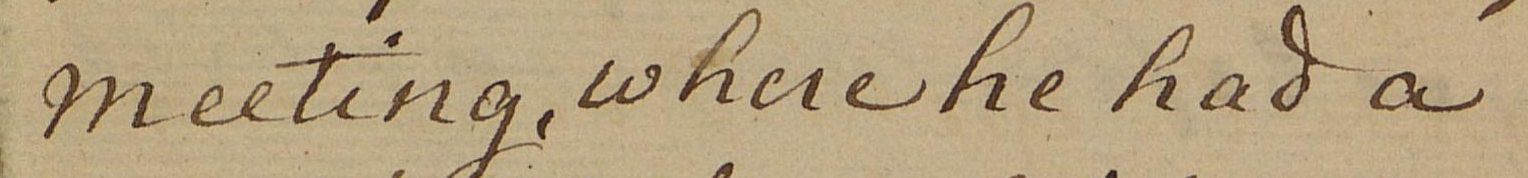meeting, where he had a
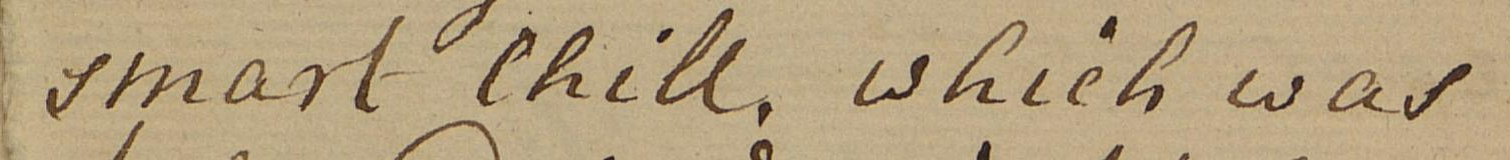smart chill, which was
